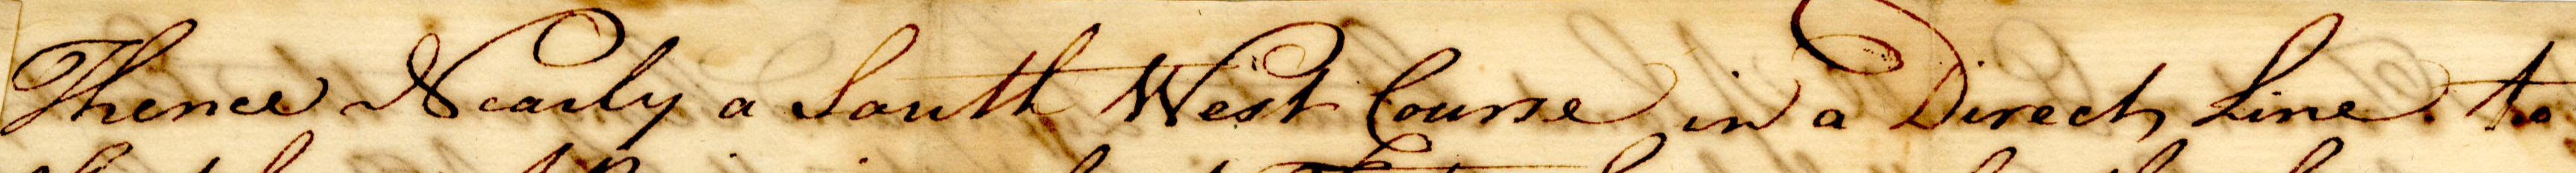Thence Nearly a South West Course in a Direct line to
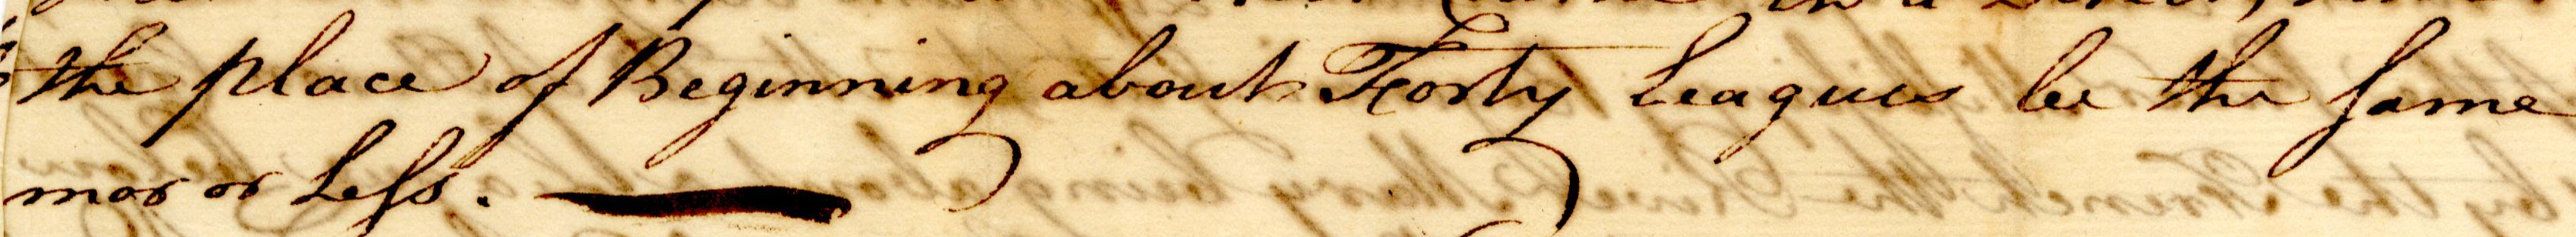the place of Beginning about Forty leagues be the same
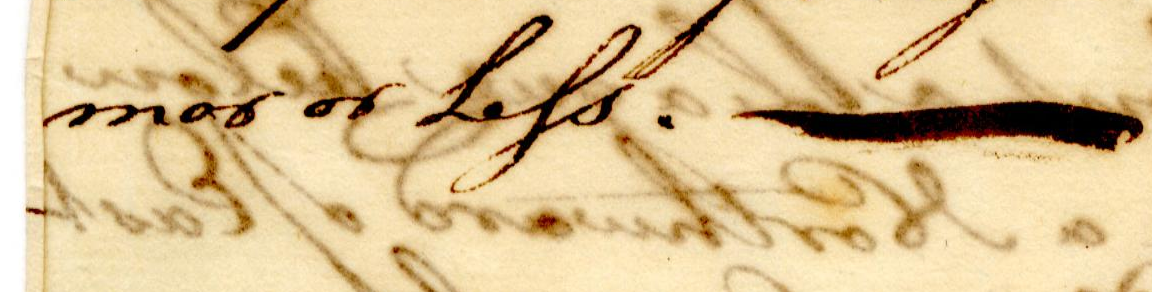mor or Less.-
